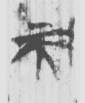天
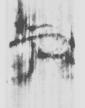下
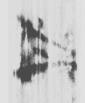之
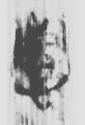情
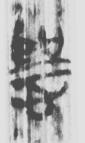{爲心}
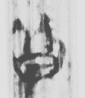皆
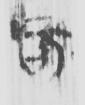可
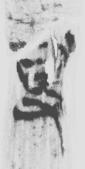𠭁
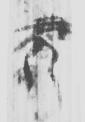而
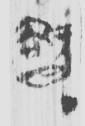智
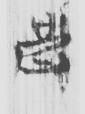皮
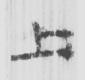上
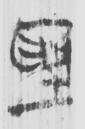聖
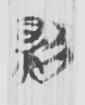則
